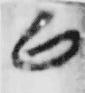㠯
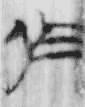於
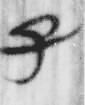子
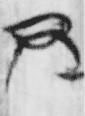尹
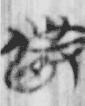○（僕）
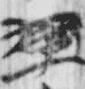軍
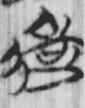造
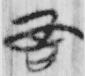言
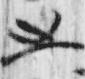之
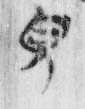視
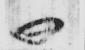日
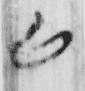㠯（以）
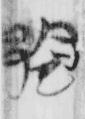陰
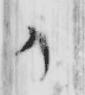人
